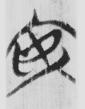安
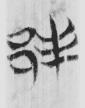邦
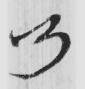乃
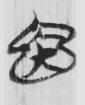因
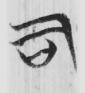司
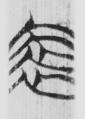{衣衣}
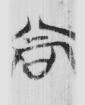尚
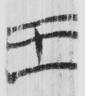王
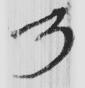乃
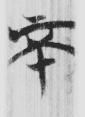不
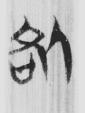咎
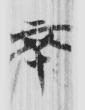不
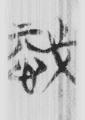{亓心戈}
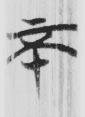不
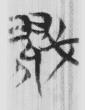戮
